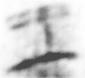王
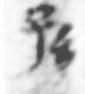孫
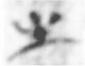生
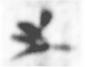之
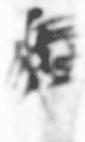騏
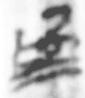爲
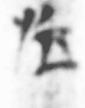○（左）
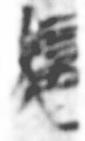驂
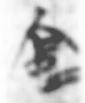○（中）
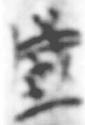城
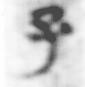子
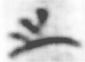之
